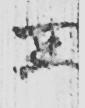五
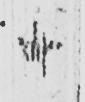十
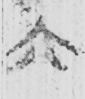六
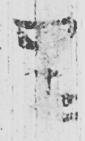四十=
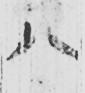八
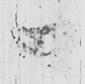四
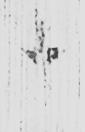十
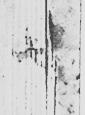卅=
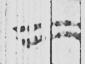二
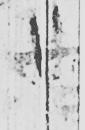廿=
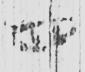四
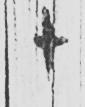十
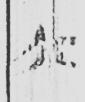六
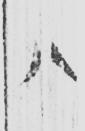八
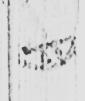四
